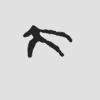下
